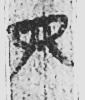四
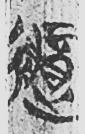{辶𨟻}
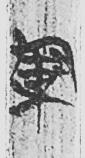軍
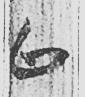㠯（以）
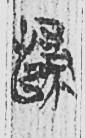{𡴎帚}
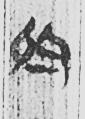於
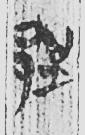郢
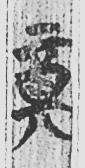奠
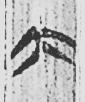太
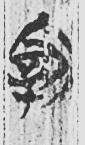{宀辛刀}
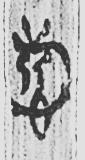{心㫃斤}
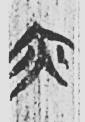亦
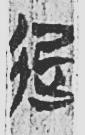起
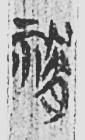禍
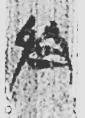於
